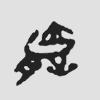{大能}
